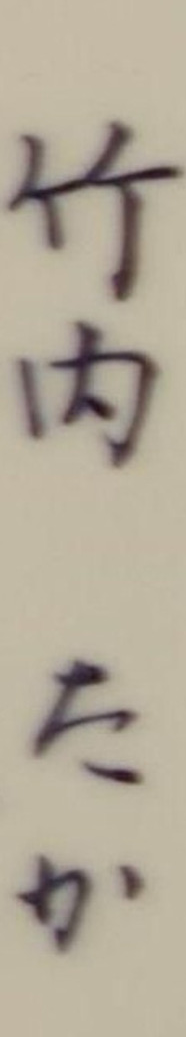竹内たか
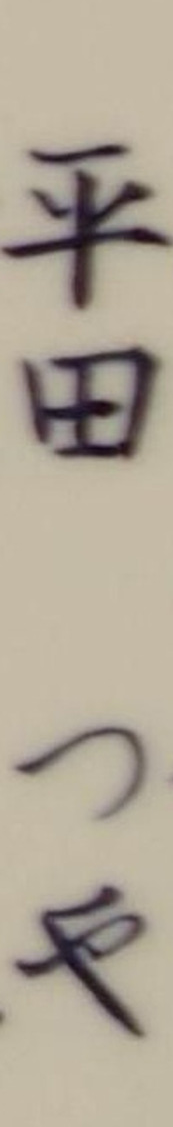平田つや
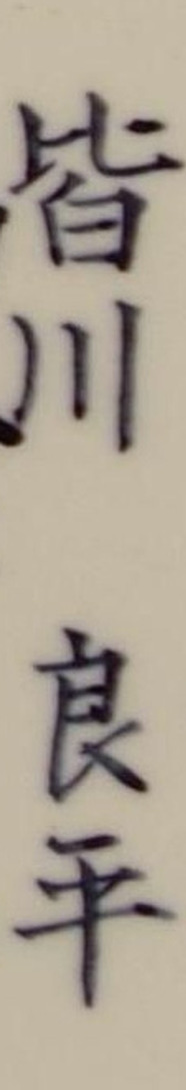皆川良平
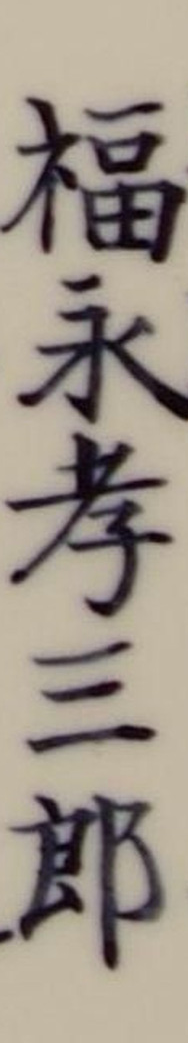福永孝三郎
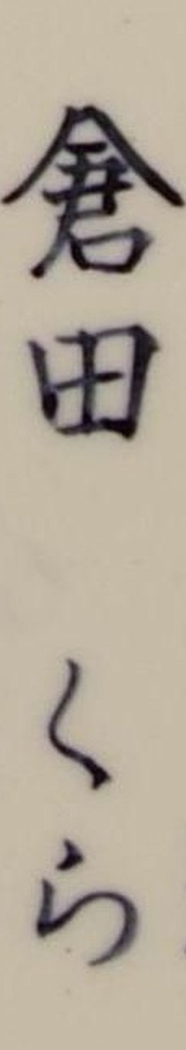倉田くら
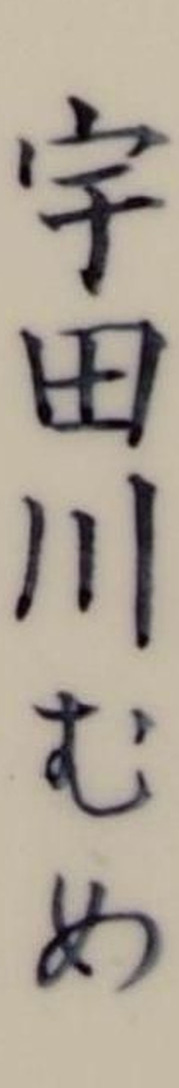宇田川むめ
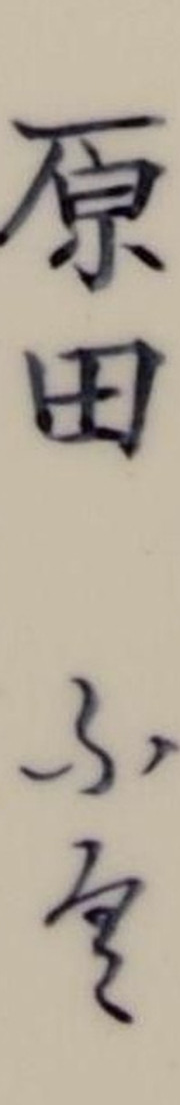原田ふく
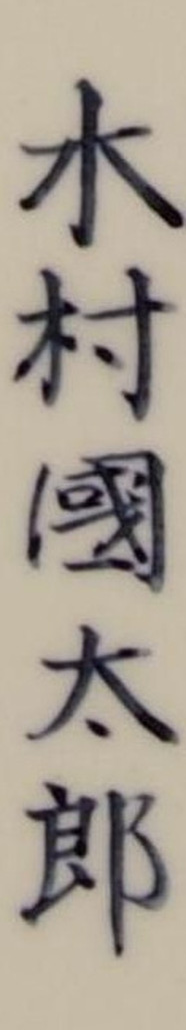木村國太郎
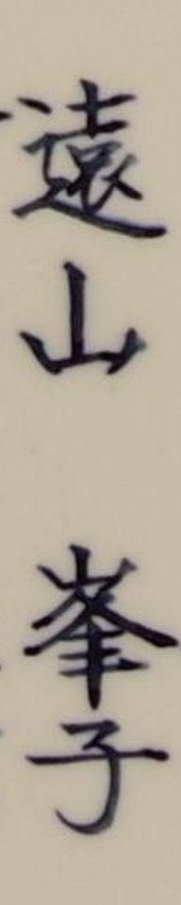遠山峯子
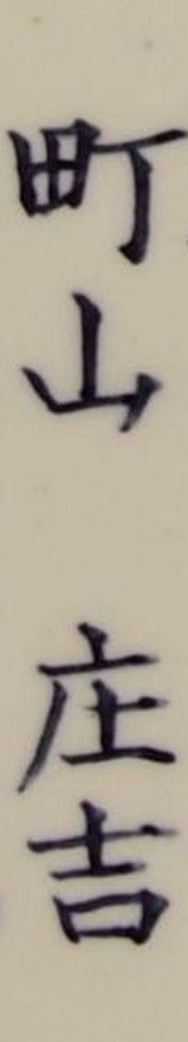町山庄吉
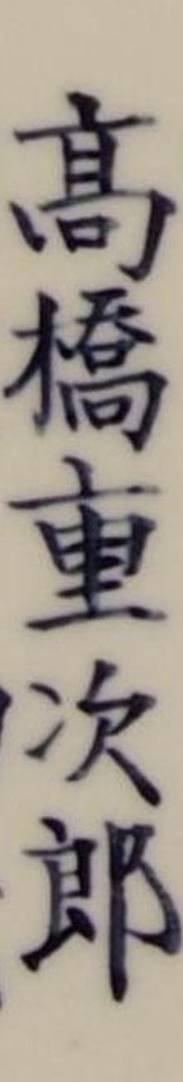高橋重次郎
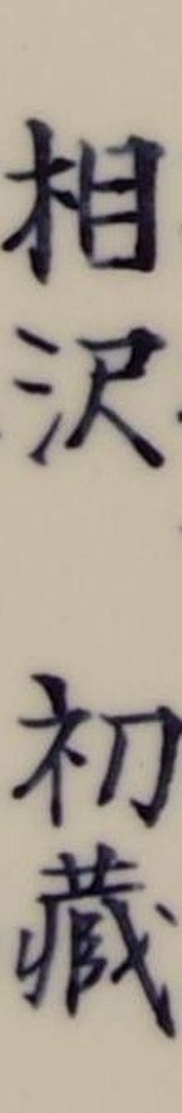相沢初蔵
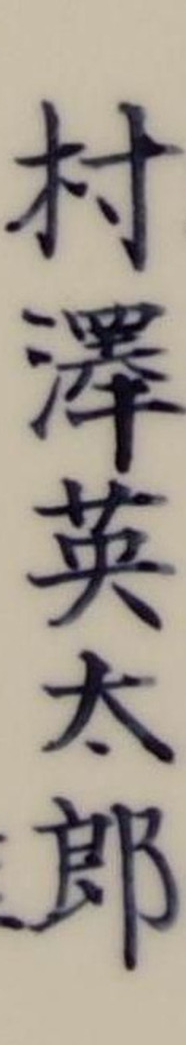村澤英太郎
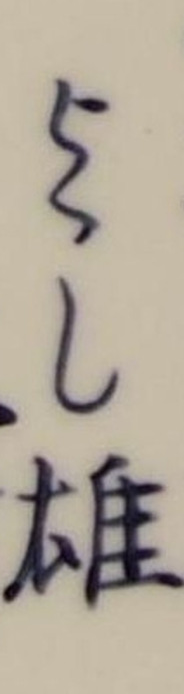よし雄
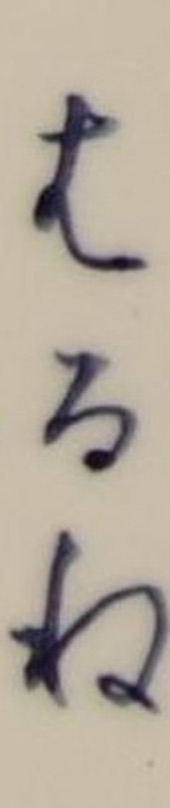はるね

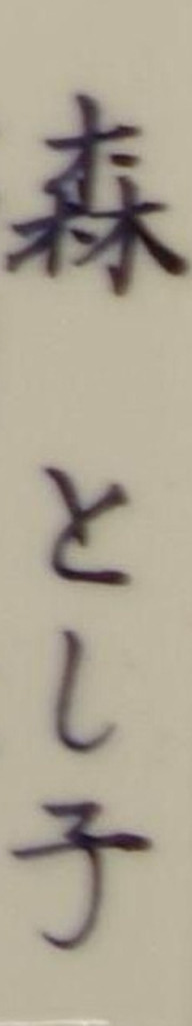森とし子
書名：M~S
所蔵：高野山金剛峯寺
